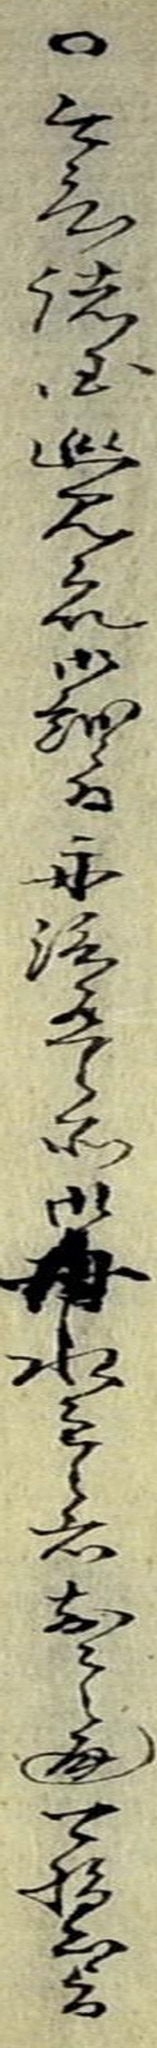〇今度諸国巡見衆御越ニ付船渡有之所御舟水主之者前々之通可指出旨
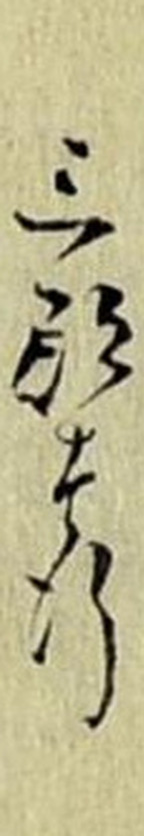三郡奉行
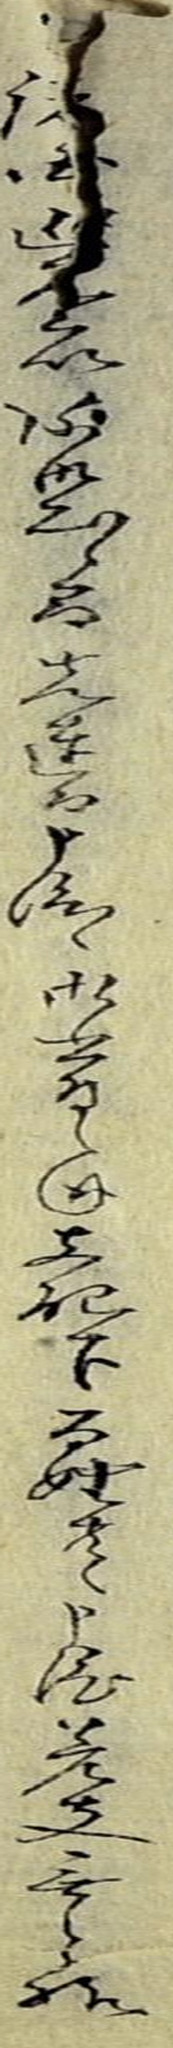〇諸国巡見衆弥御出候間先達而申渡候御書付之趣支配下百姓共へ申渡差支無之様
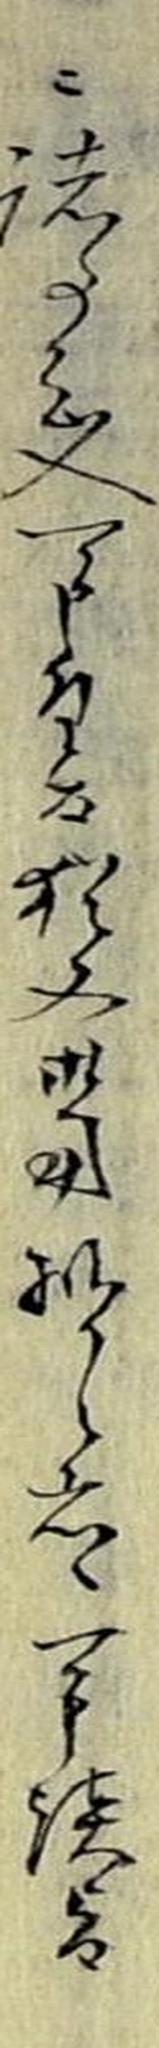ニ諸事念入可申付旨猶又御用掛り之者へ可申談旨
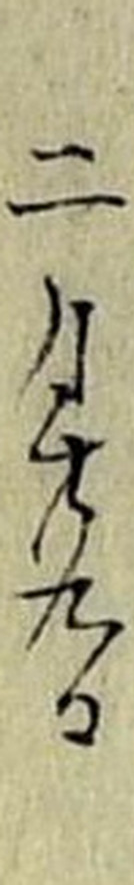二月廿九日
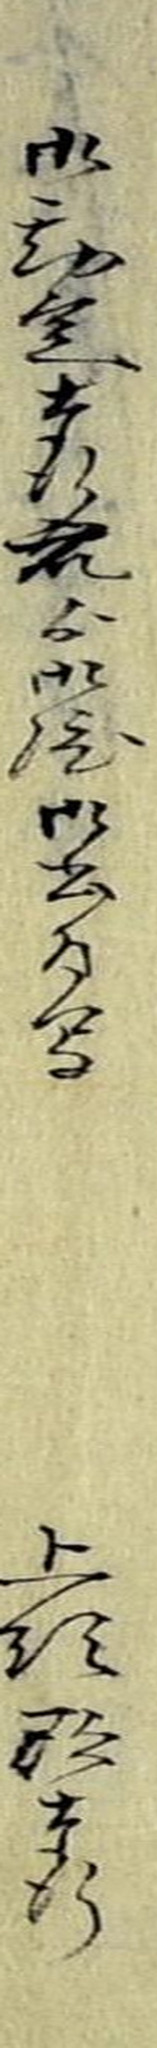御勘定奉行衆ゟ御渡御書付写上領郡奉行
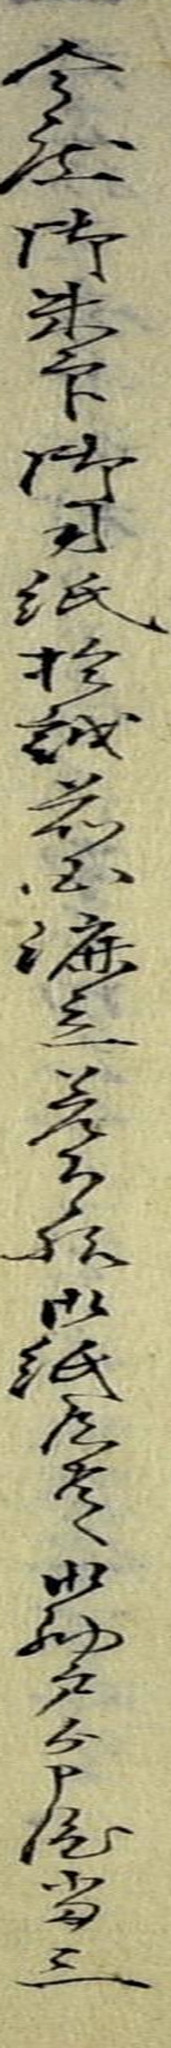〇今度御朱印御用紙於越前国漉立差下候様御紙屋共へ御納戸ゟ申渡当三
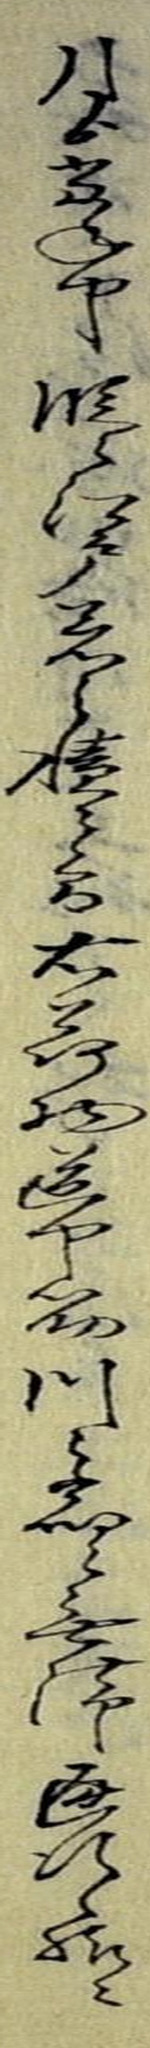月ゟ当年中段々江戸着之積ニ候間右荷物道中筋川々宿々無滞通行候様ニ
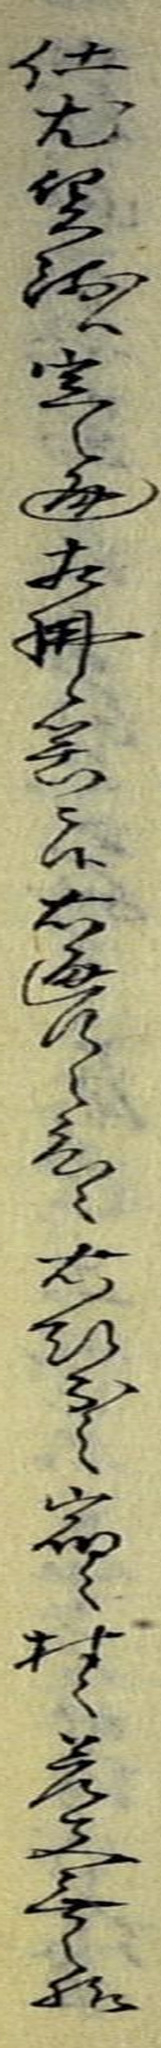仕尤賃銭ハ定之通相払候筈ニ候右通行之度々右領分之宿々村々差支無之様
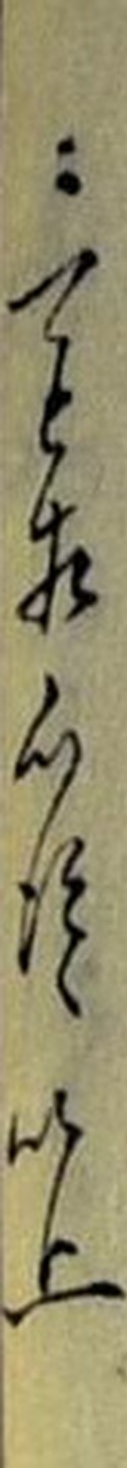ニ可被相心得候以上
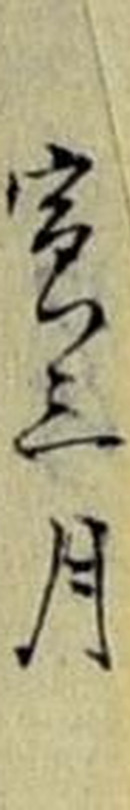寅三月
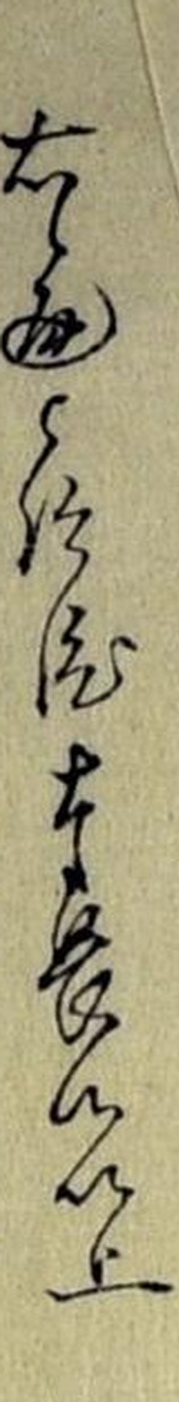右之通被仰渡奉畏候以上
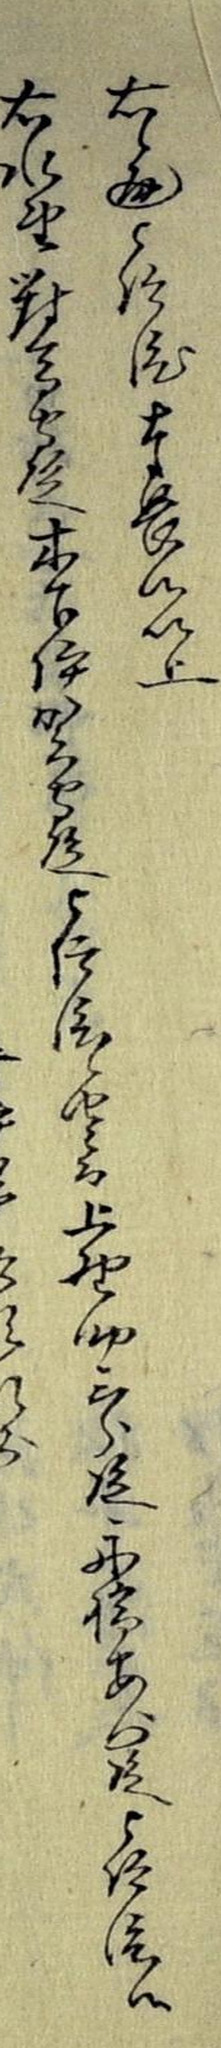右水野対馬守殿木下伊賀守殿被仰渡候由ニ而上野助三郎殿舟橋安右衛門殿被仰渡候

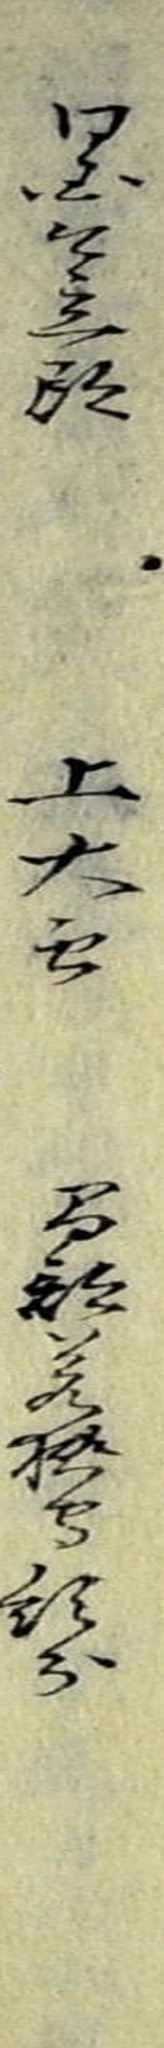同国今立郡上大虫間部若狭守領分
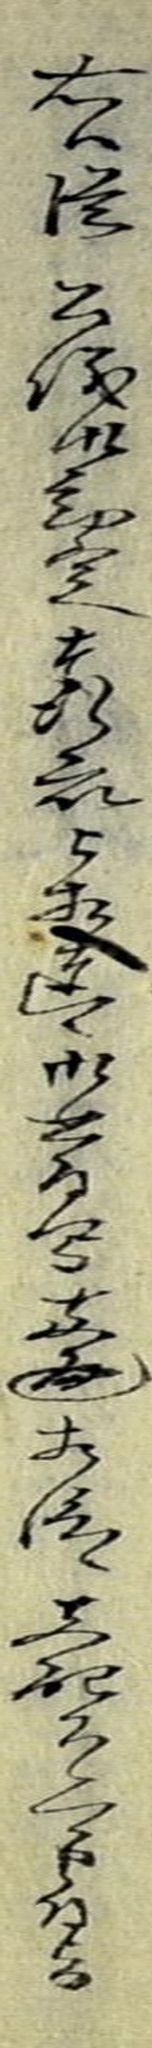右ハ従公儀御勘定奉行衆被相達候御書付写両通相渡候支配下へ可申付旨
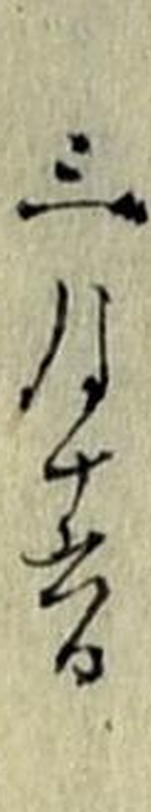三月十六日
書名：命令之部 一
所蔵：福井県文書館 Fukui Prefectural Archives
